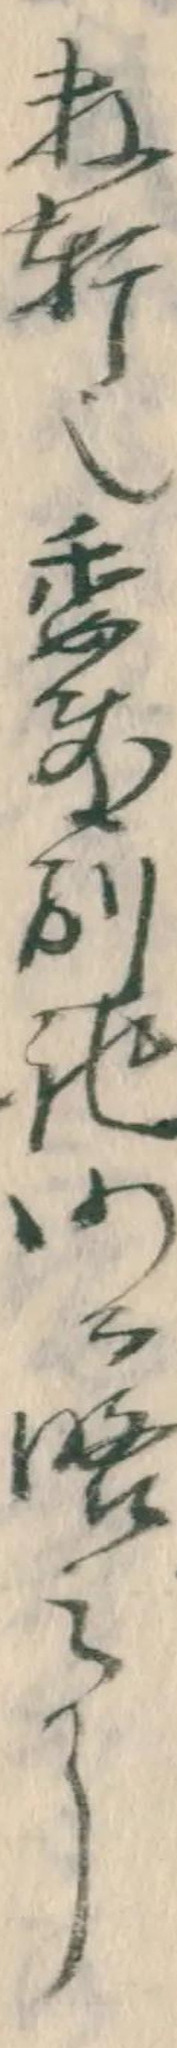数軒也委敷別記仍而略之了
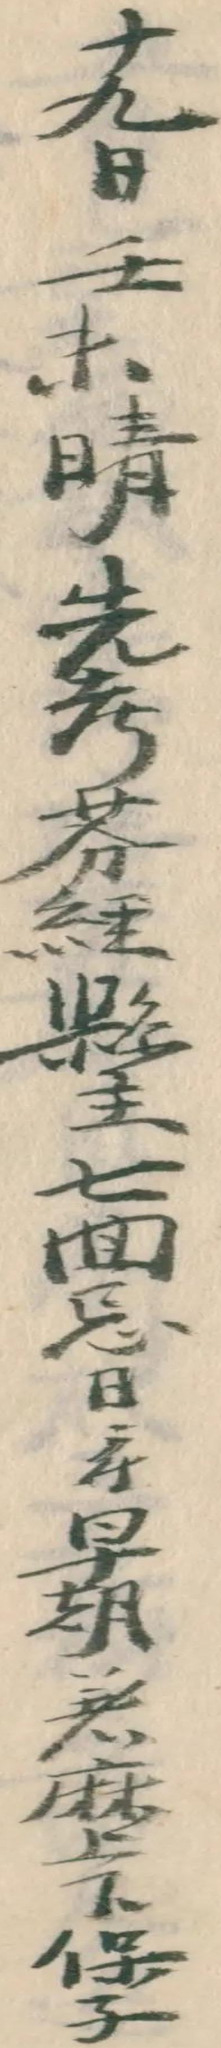十九日壬未晴先考芬経縣主七回忌日に付早朝着麻上下保子
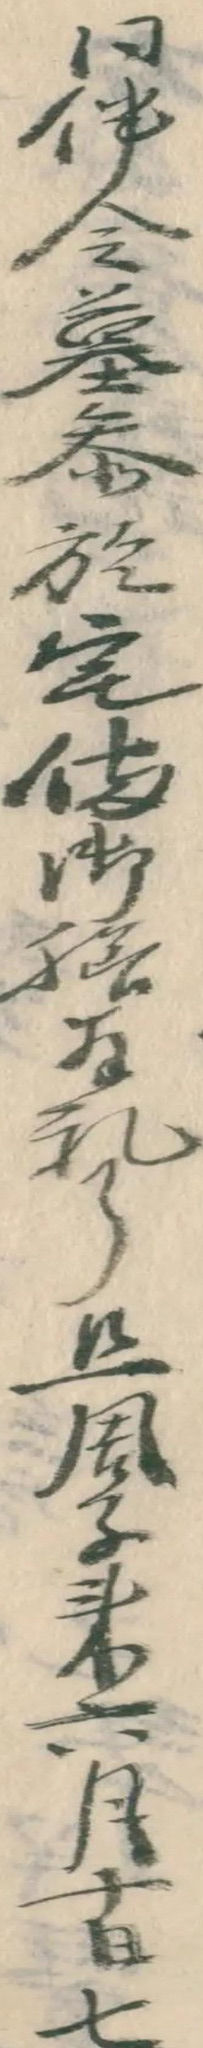同伴令墓参於宅備御膳相礼了且周子来六月十日七
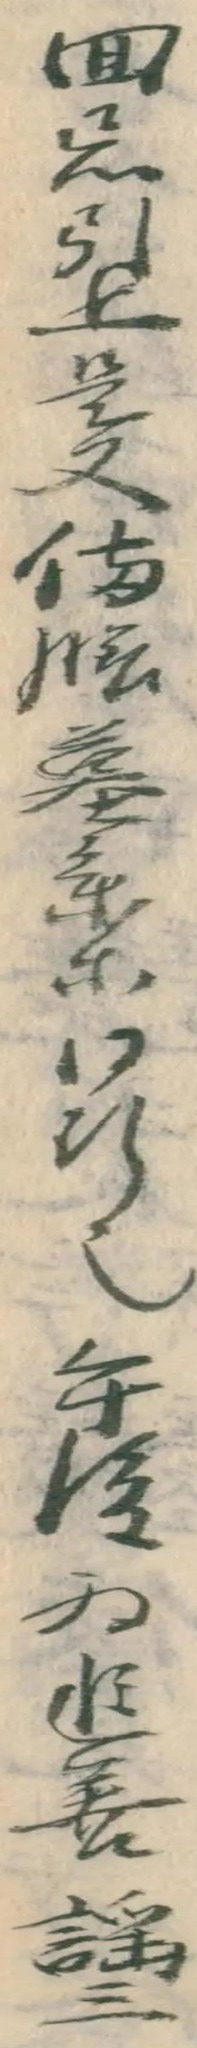回忌引上是又備膳墓参等同断也午後為追善謡三

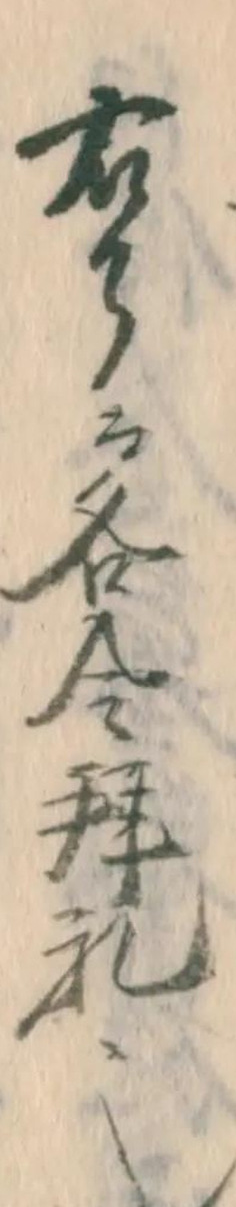右了而各令拝礼也
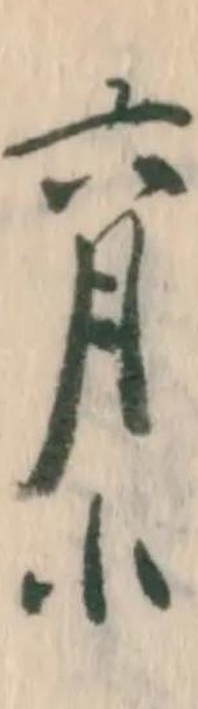六月小
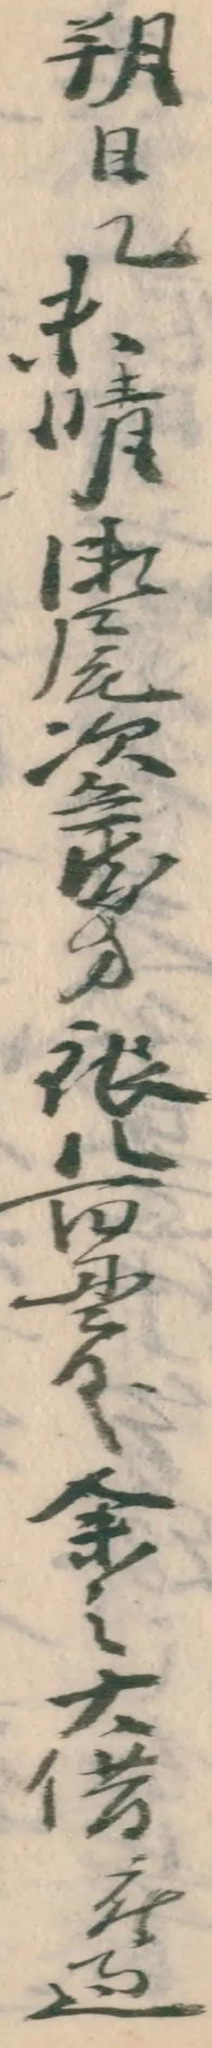朔日乙未晴瀬尾次兵衛方銀八百貫匁余之大借ニ付過
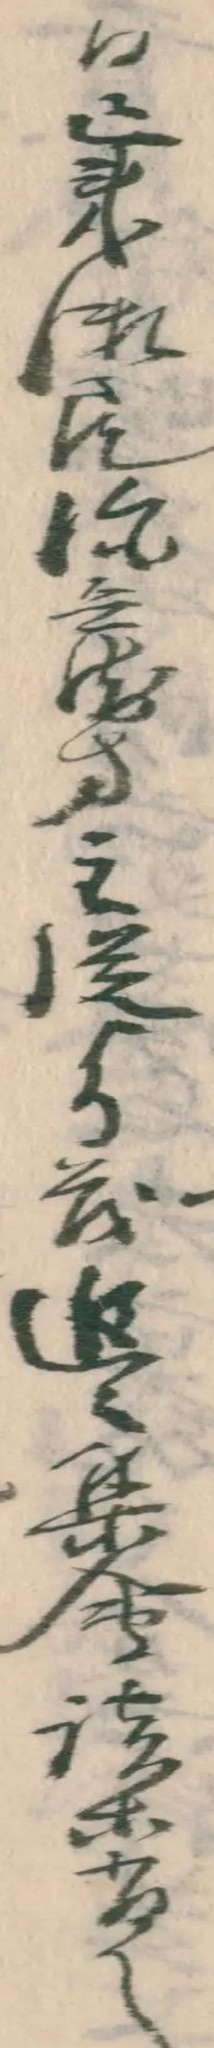日已来瀬尾弥兵衛方主従よりも追々集會談等有之
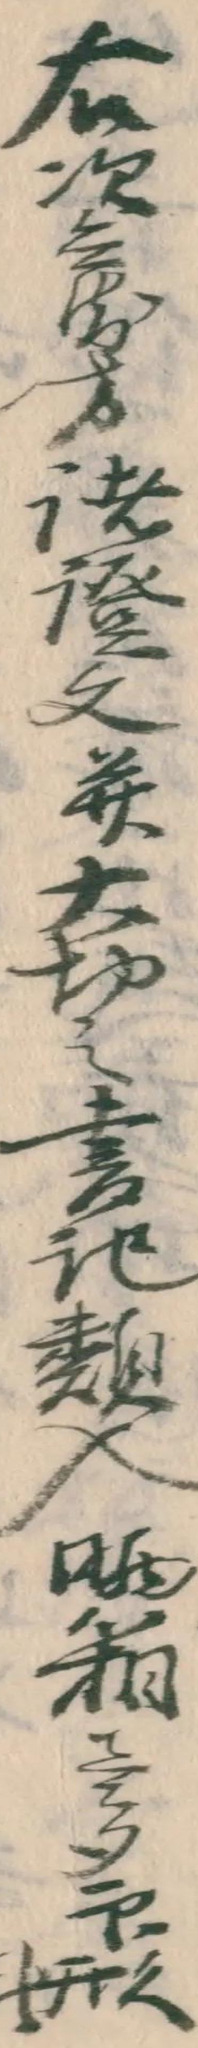右次兵衛方諸證文并大切之書記類入晒箱壱夕印形封
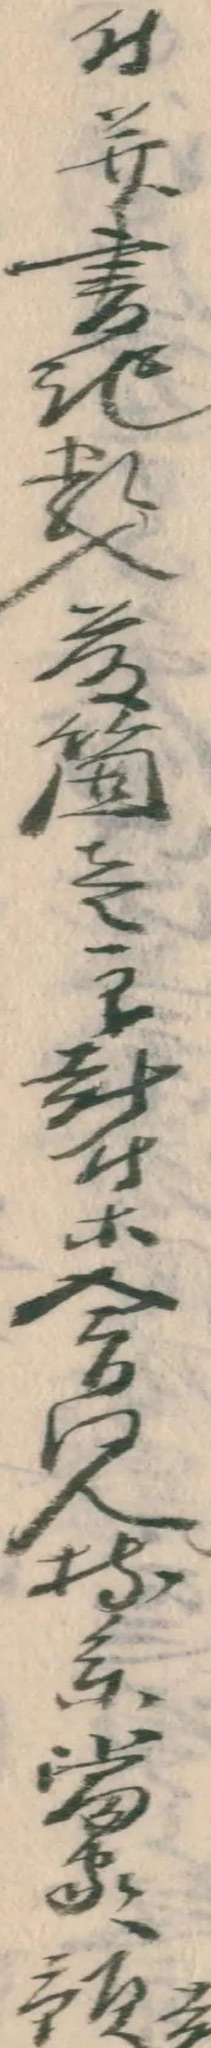付幷書記類入藤筒壱印封付等今日同人持参當家へ預
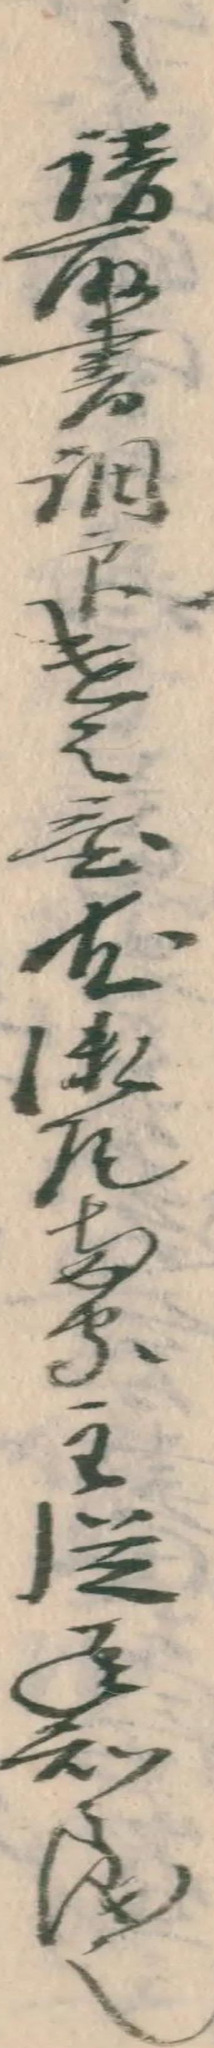之請取書調印遣之置尤瀬屋両家主従承知之儀也
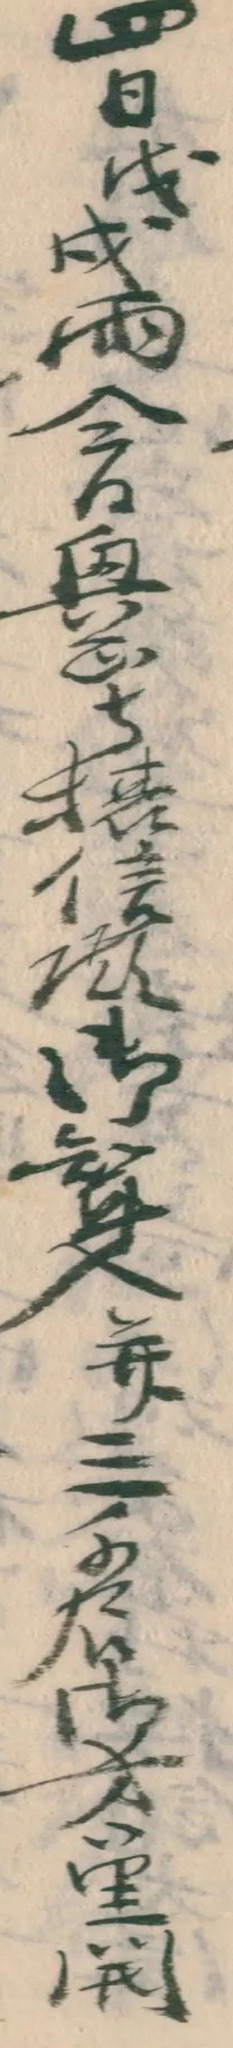四日戊戌雨今日興正寺摂信殿御婿入幷三千居御方御里開
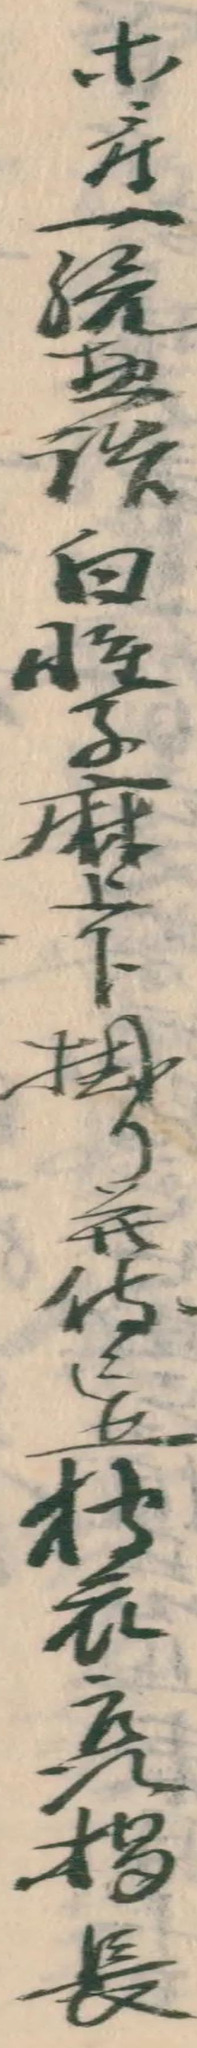等ニ付一統惣詰白帷子麻上下掛り并侍已上狩衣取次掲長
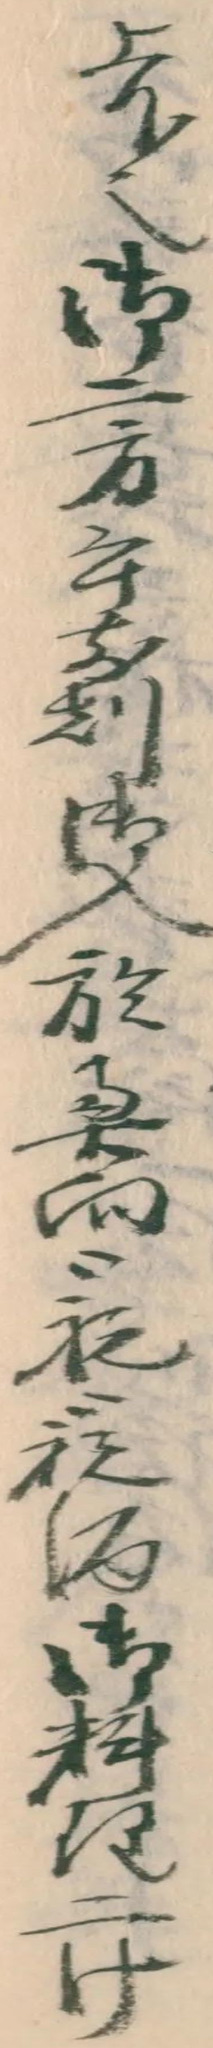上下也御二方午前刻御入於奥向御祝御祝酒御料理二汁
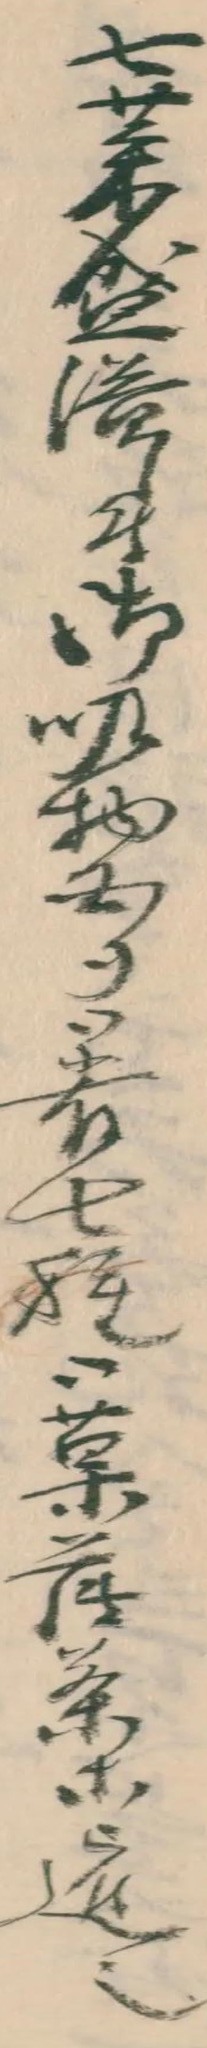七菜盛横付御吸物五ツ御肴七種御菓茂茶等被進之
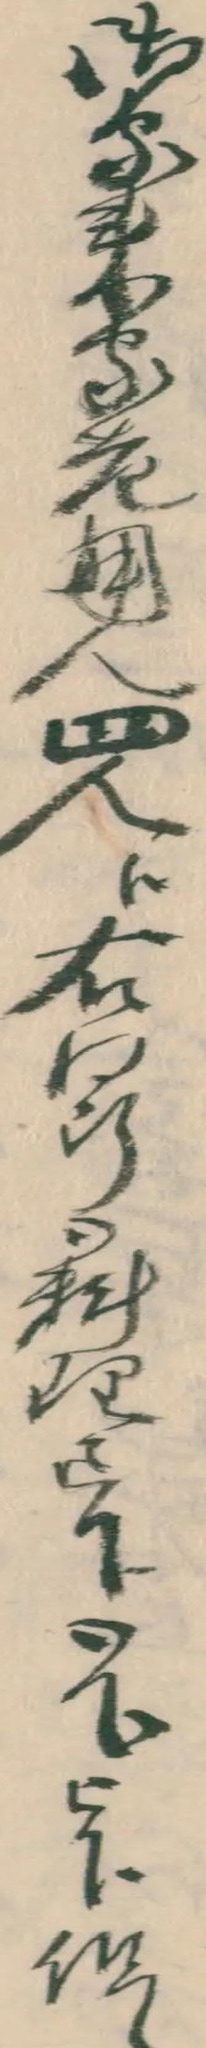御家来家老用人四人え右同断御料理已下御下被下但し
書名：賀茂社記録. 第66冊
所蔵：国立国会図書館 National Diet Library, JAPAN
